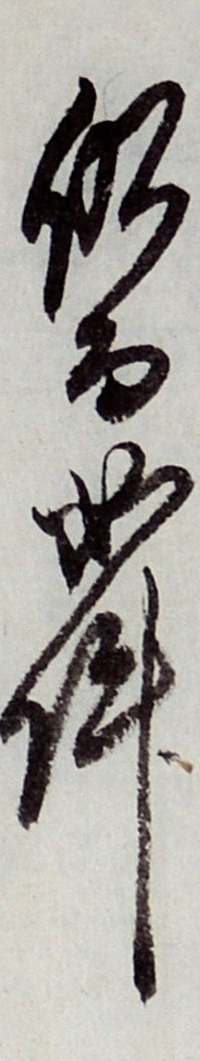仍而如件
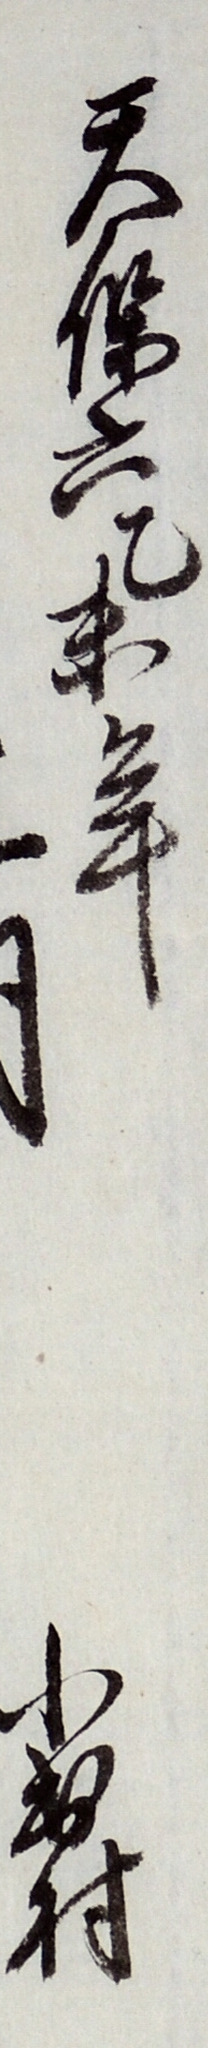天保六乙未年三月
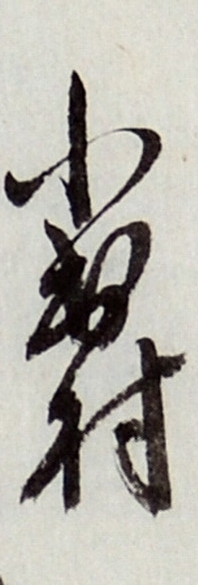小出村
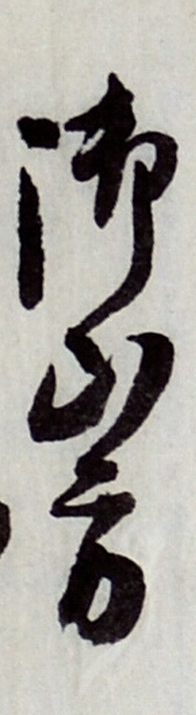御山方
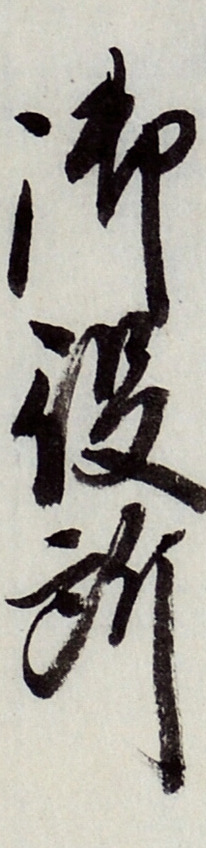御役所

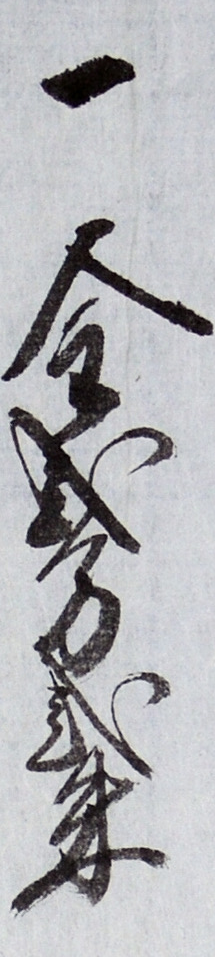一金弐分弐朱
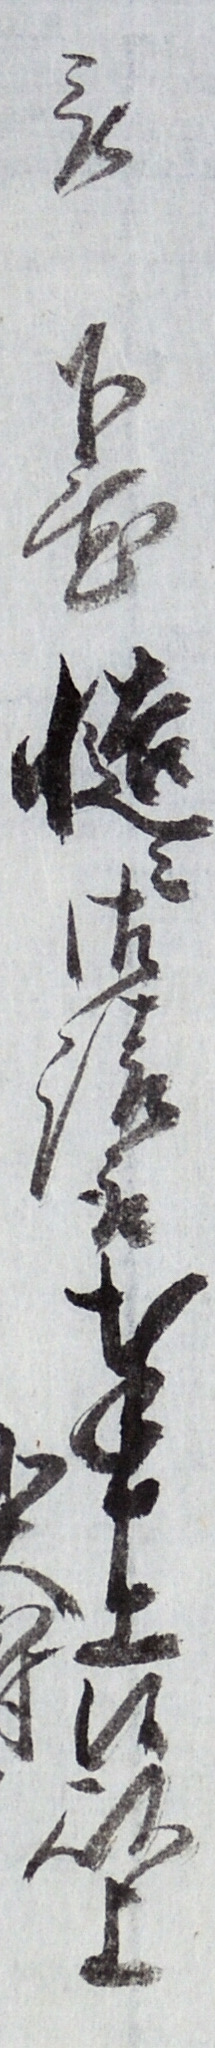被下置慥ニ御請取奉申上候以上
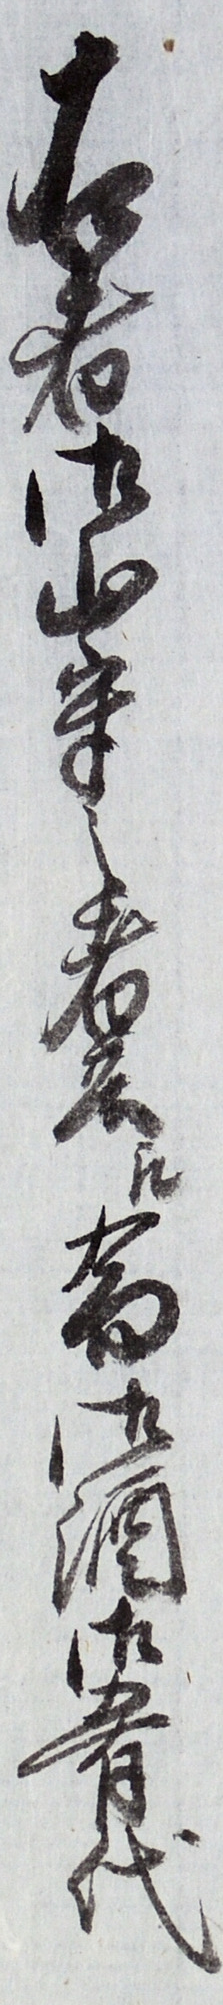右者御山守之者共江為御酒御肴代
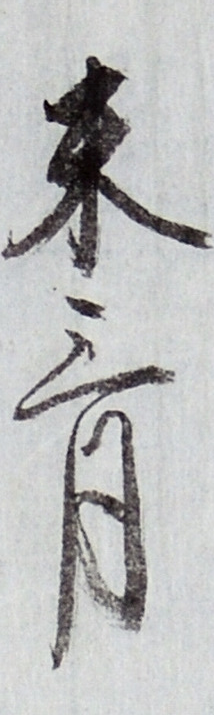未三月
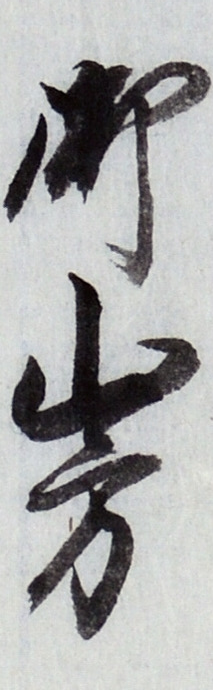御山方
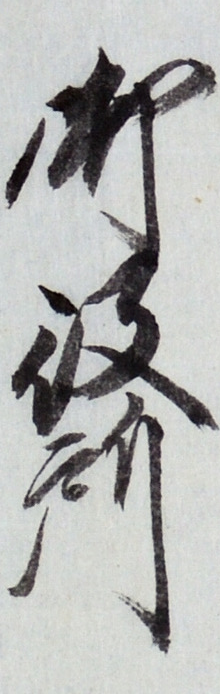御役所
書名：覚
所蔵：伊那市立高遠町図書館・合同会社AMANE
